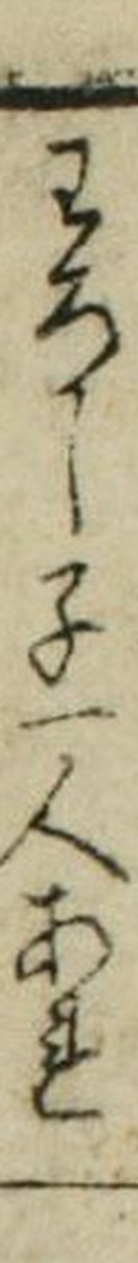わろし子一人あれ
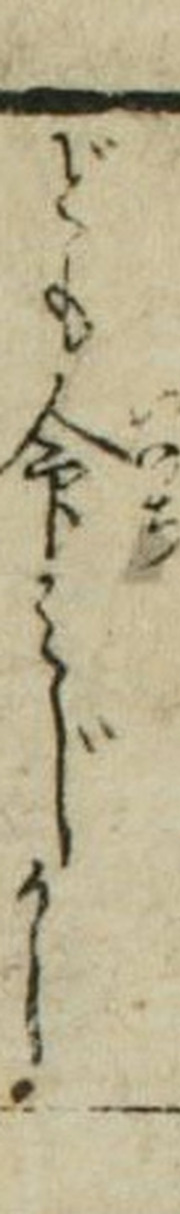ども命みじかし
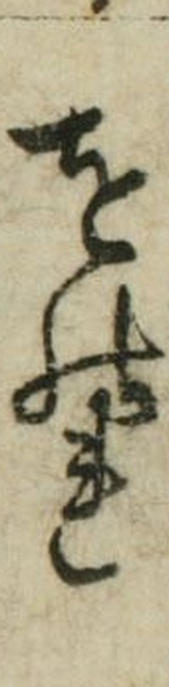をのれ
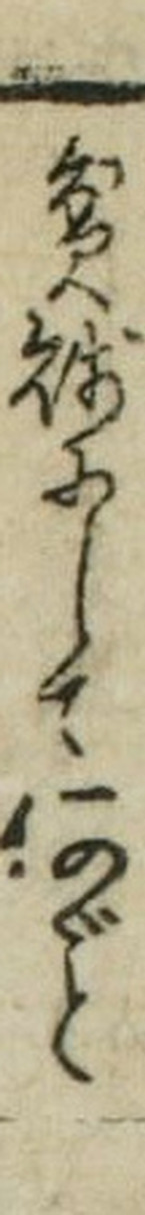貧賎にして何ごと
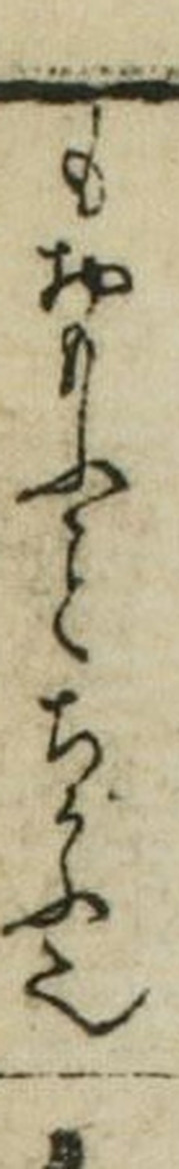もおもふことちがふ也
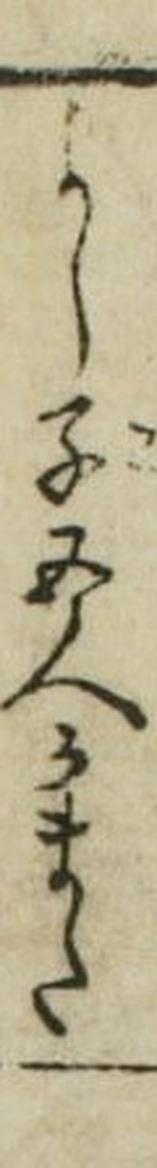よし子五人かまた
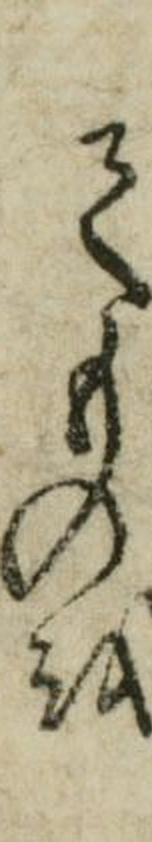てものを
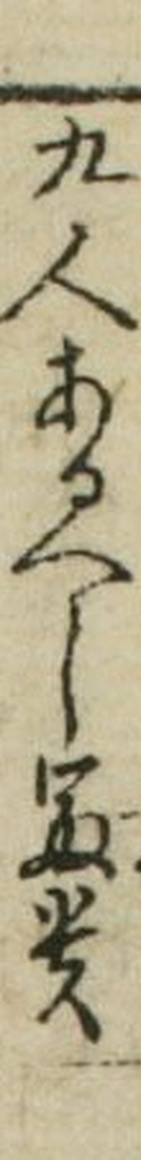九人あるへし富貴
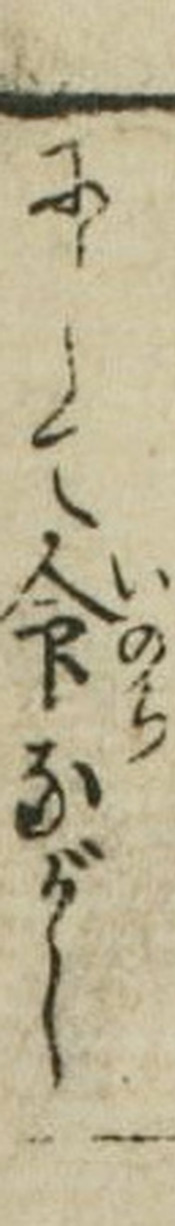にして命ながし
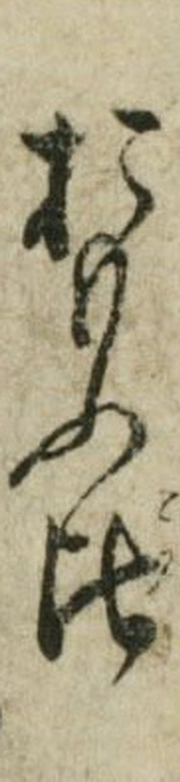おもふ比
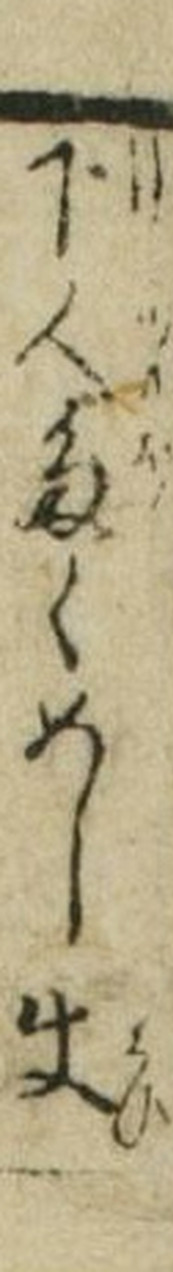下人多くめし使
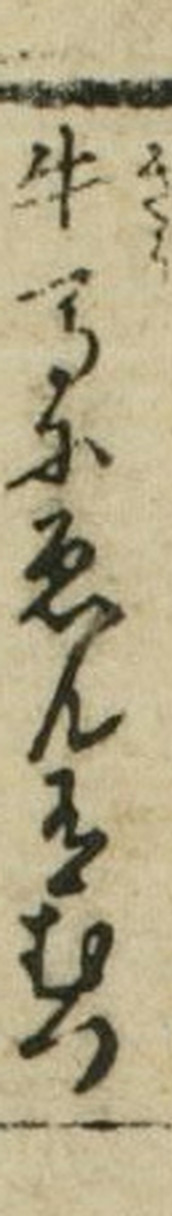牛馬にゑん有むつ
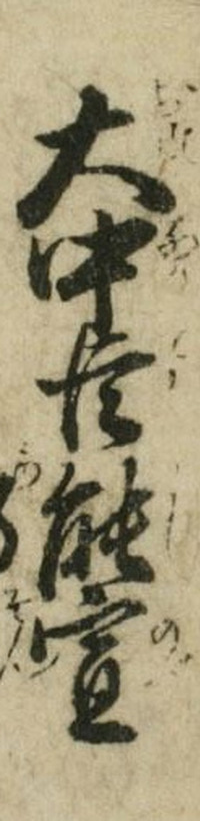大中臣能宣
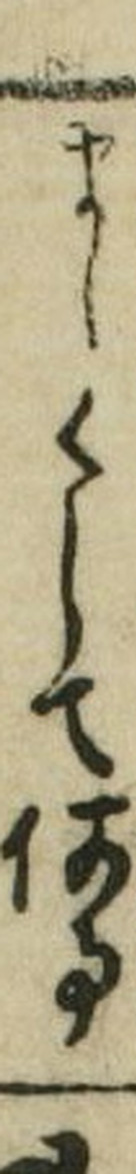ましくして何事
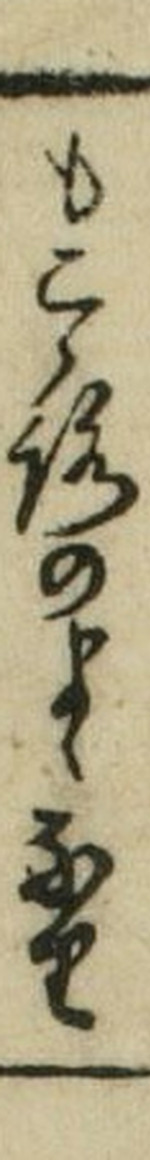もこゝろのまゝなり
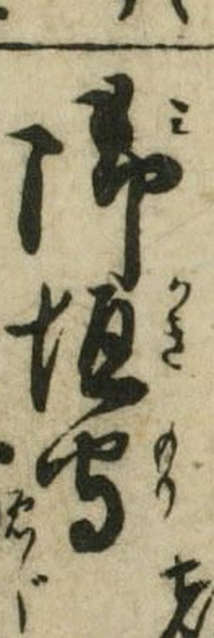御垣守
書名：百人一首
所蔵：東京学芸大学教育コンテンツアーカイブ
